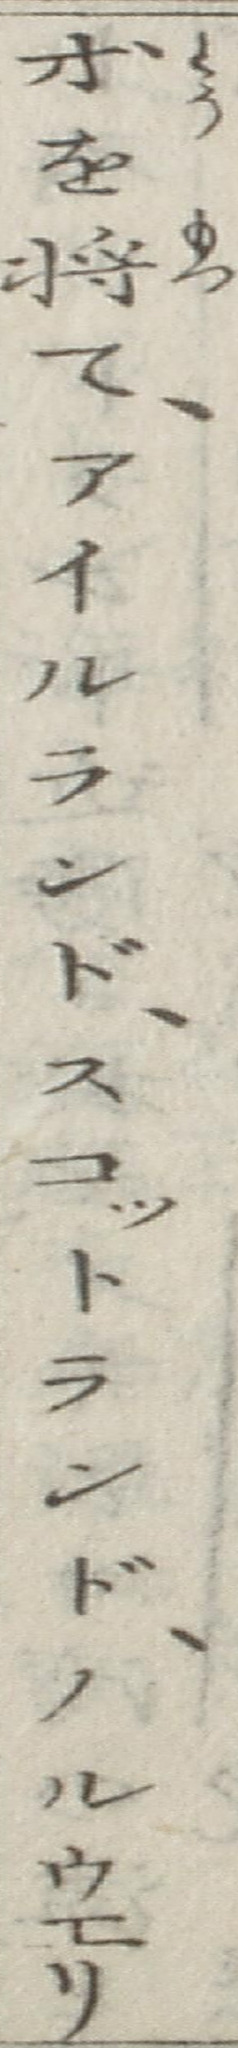等を将て、アイルランド、スコットランド、ノルウエリ
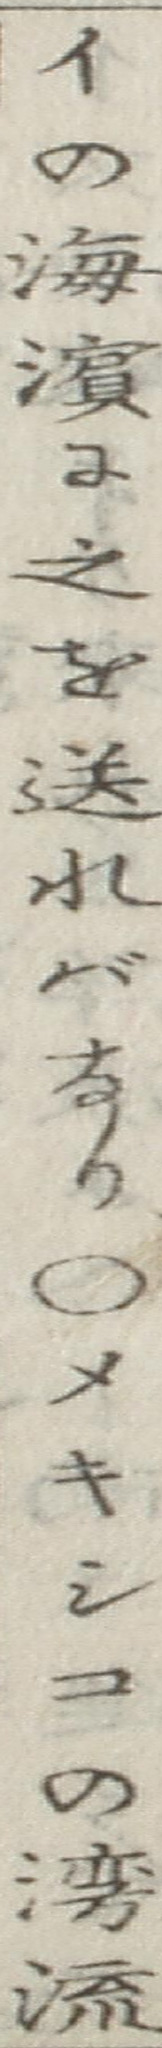イの海浜に之を送ればなり、〇メキシコの湾流
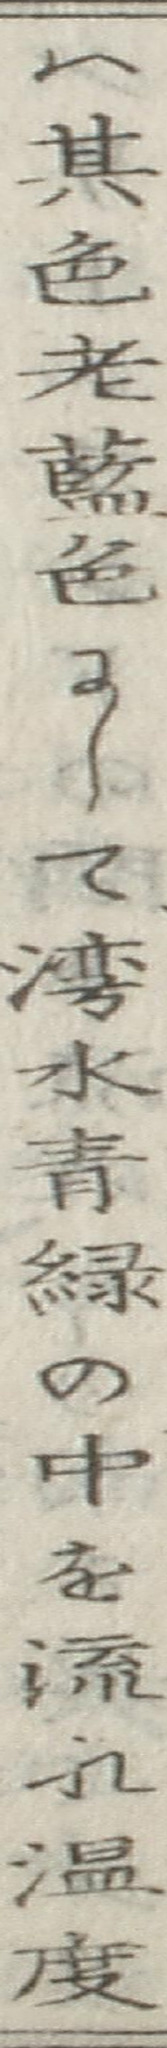は其色老藍色にして、湾水青緑の中を流れ、温度
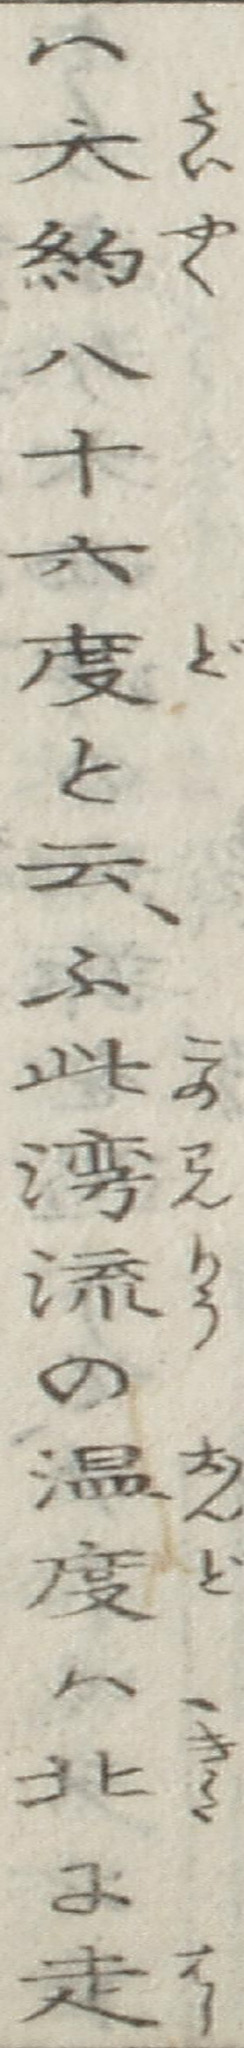は大約八十六度と云、ふ此湾流の温度は、北に走
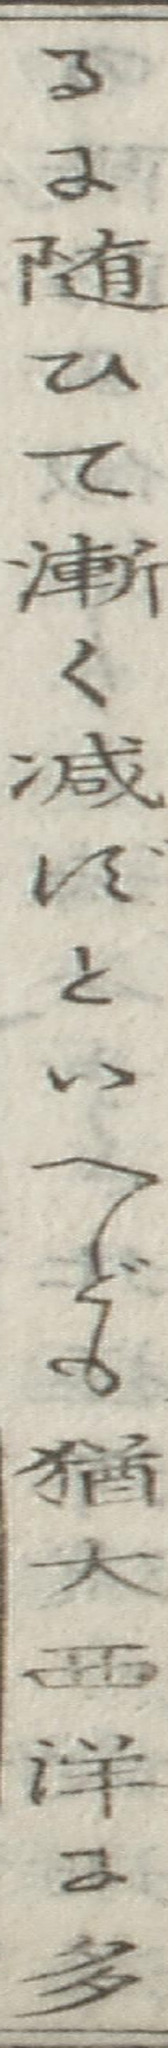るに随ひて漸く減ずといへども、猶大西洋に、多
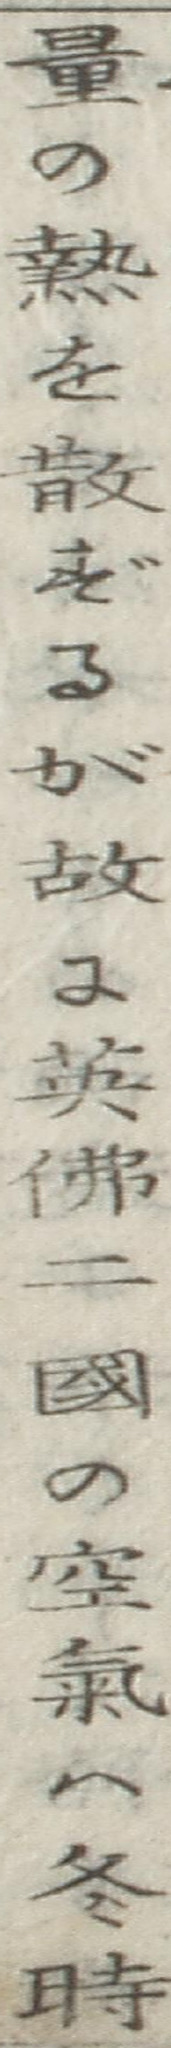量の熱を散ずるが故に、英仏二国の空気は、冬時
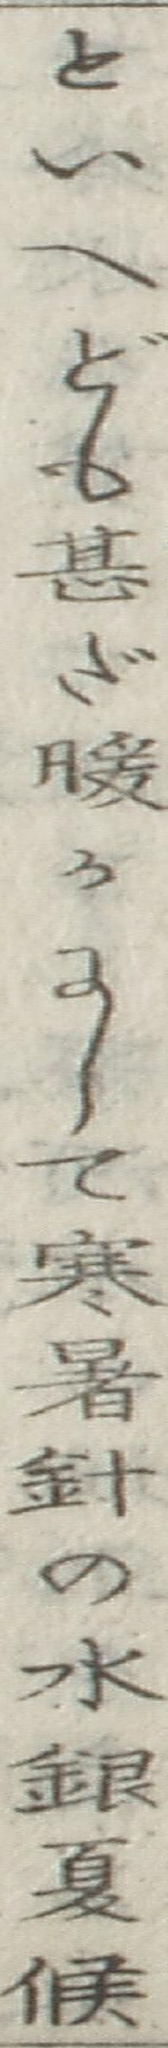といへども甚だ暖かにして、寒暑針の水銀夏候
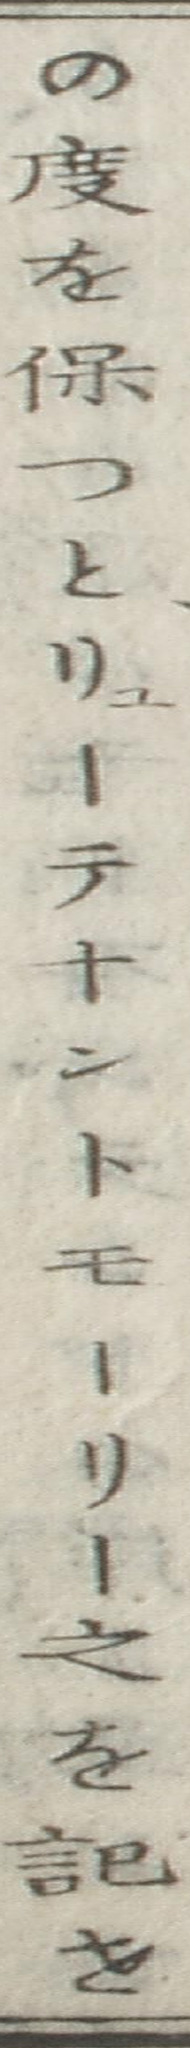の度を保つと、リューテナントモーリー之を記せ

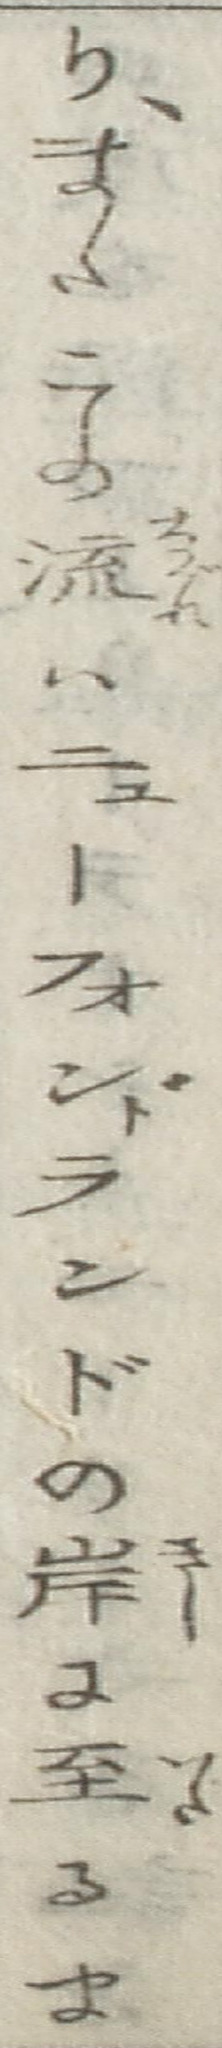り、またこの流はニューフォンドランドの岸に至るま
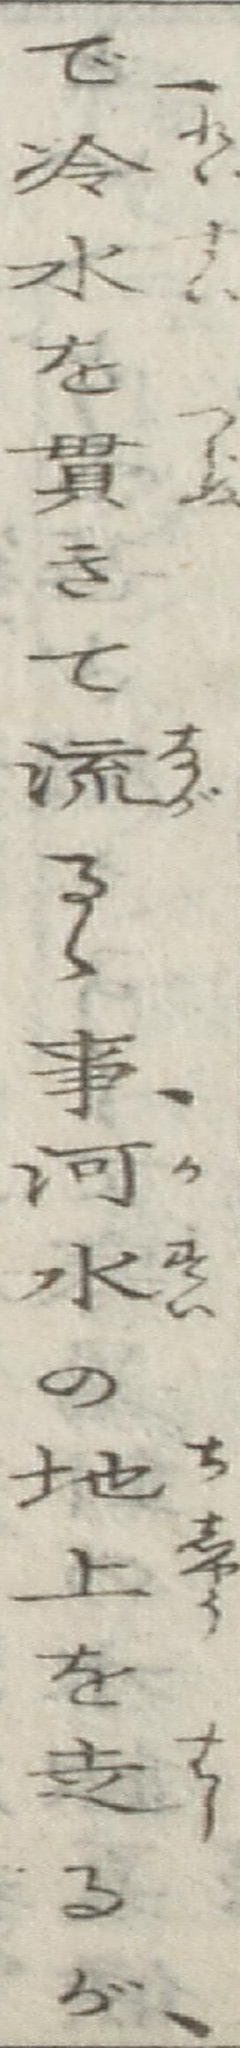で、冷水を貫きて流るゝ事、河水の地上を走るが
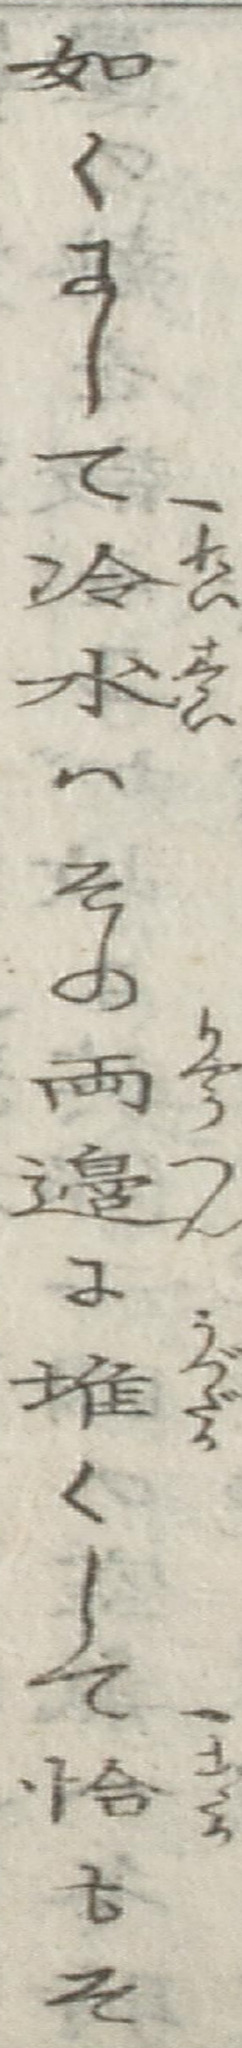如くにして、冷水はその両辺に堆くして、恰もそ
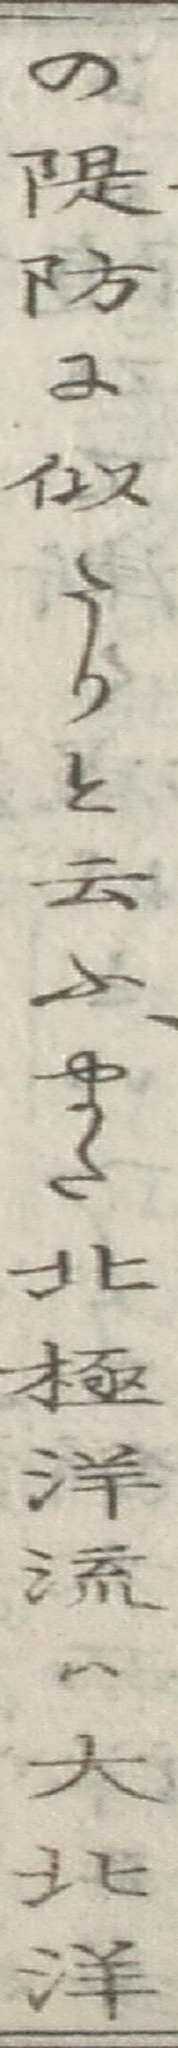の堤防に似たりと云ふ、また北極洋流は大北洋
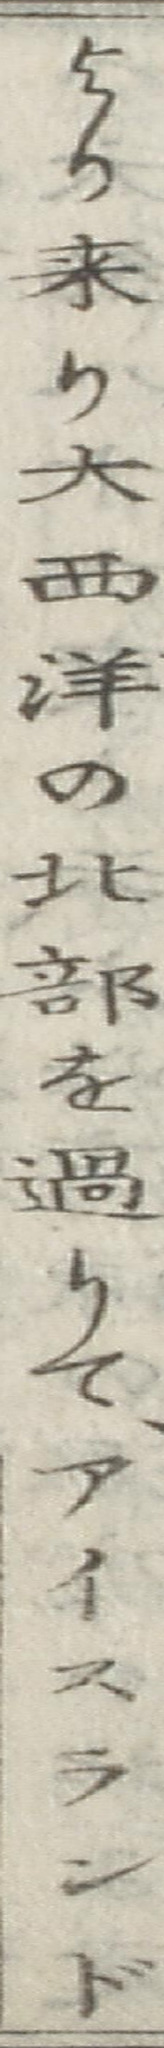より来り、大西洋の北部を過りて、アイスランド
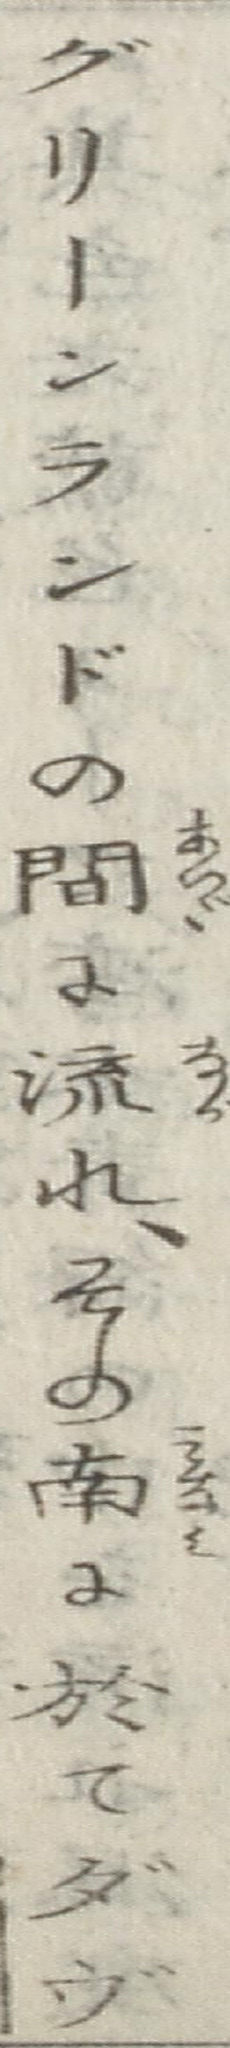グリーンランドの間に流れ、その南に於てダヴ
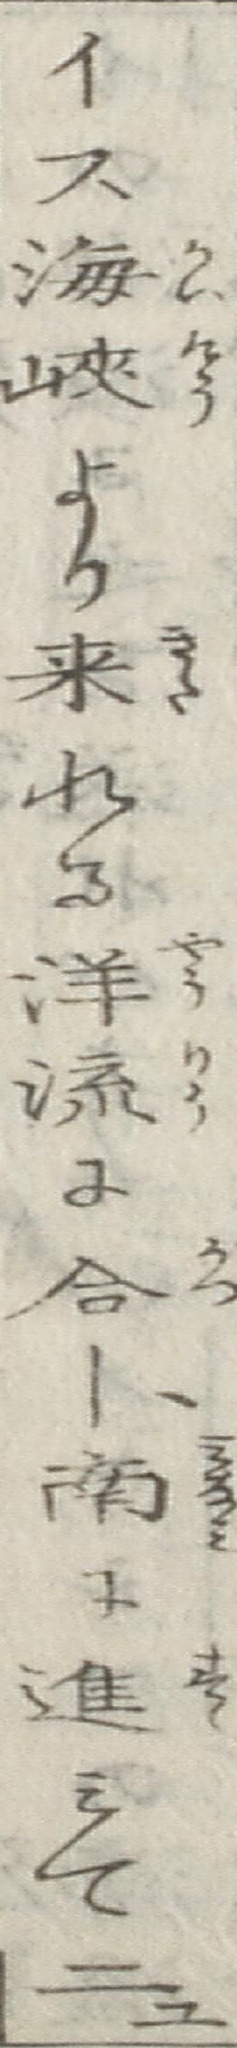イス海峡より来れる洋流に合し、南に進みてニュ
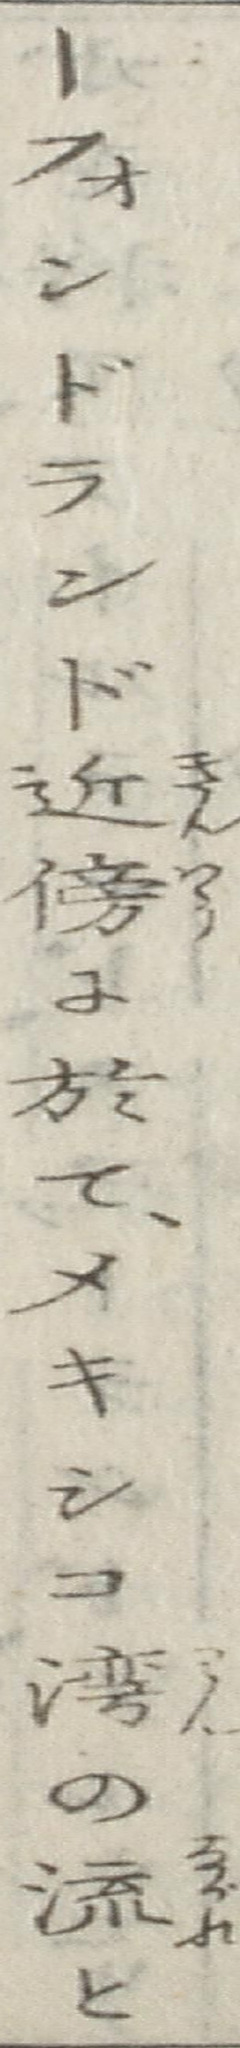ーフォンドランド近傍に於て、メキシコ湾の流と
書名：訓蒙　天然地理學　中
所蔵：東京大学地震研究所図書室 Earthquake Research Institute Library, The University of Tokyo, JAPAN
